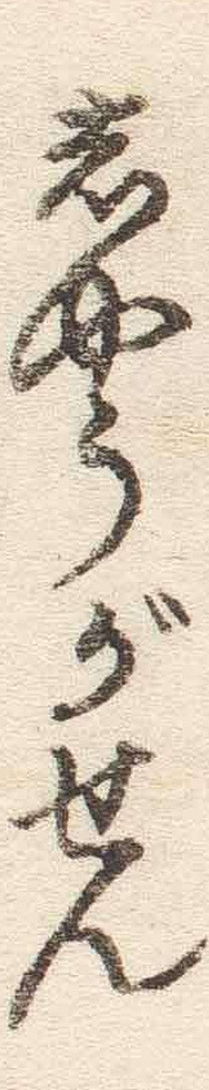しやうがせん
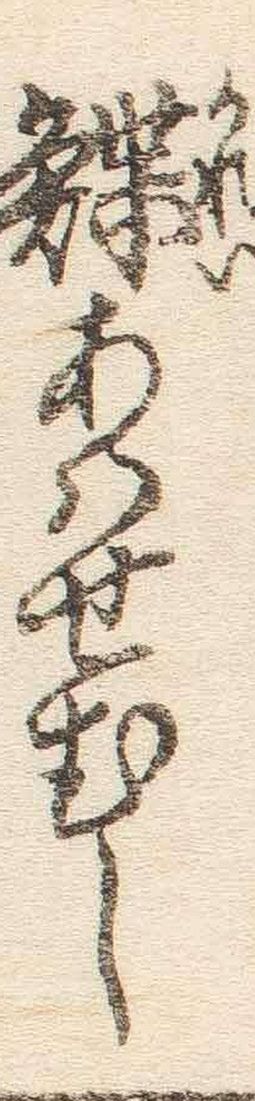鰈あはせむし豆腐
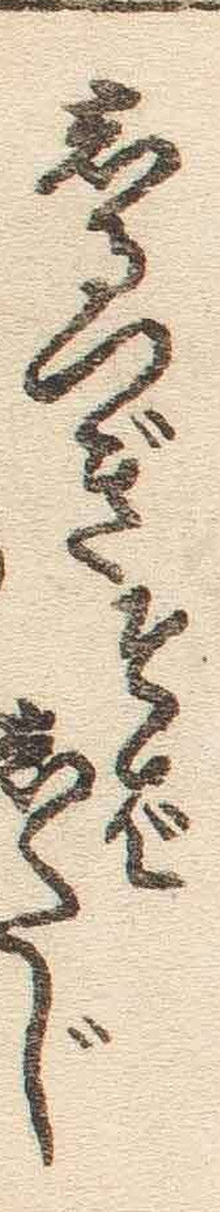しるつぎそばふさ山椒
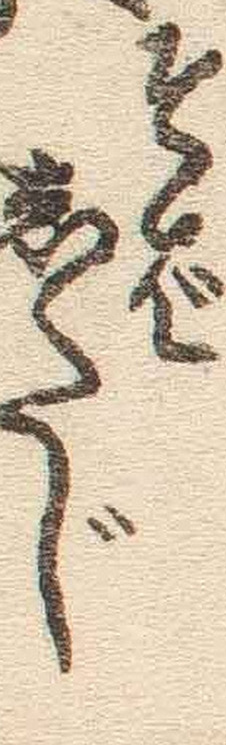したじ
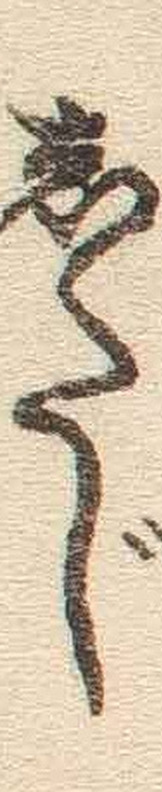したじ
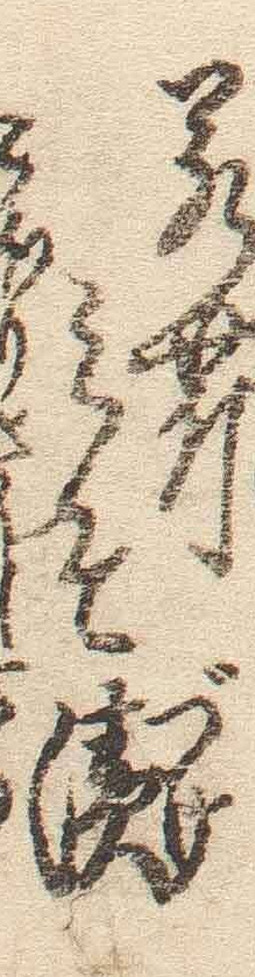みそ漬
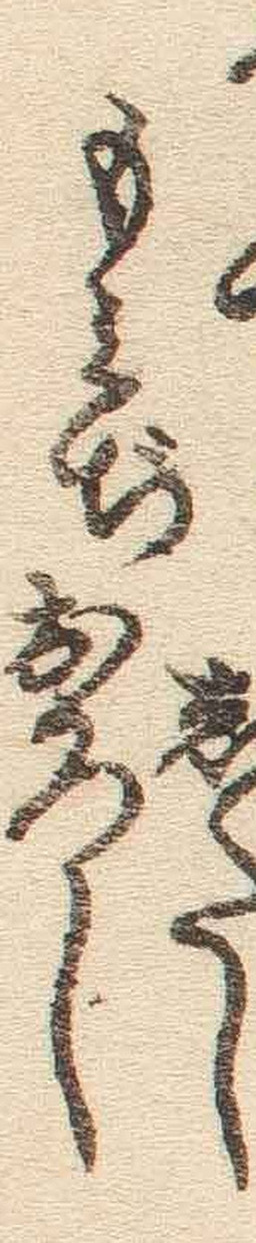もみぢおろし
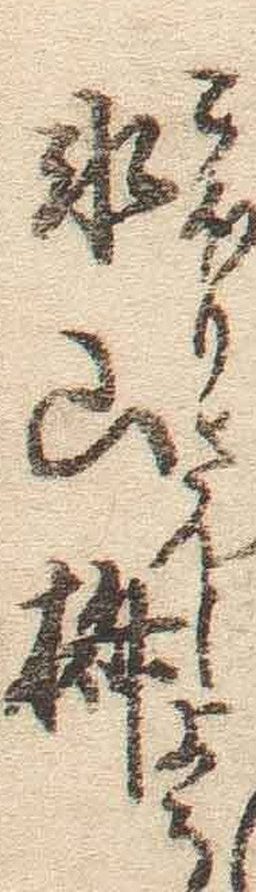氷山椒

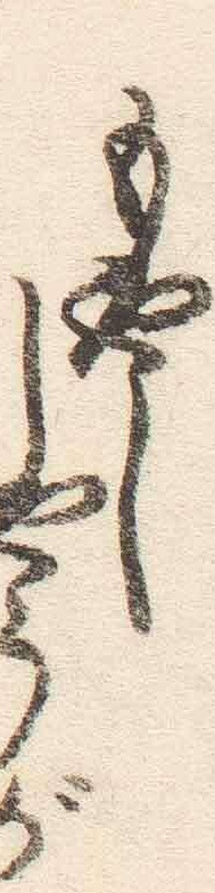しやうが
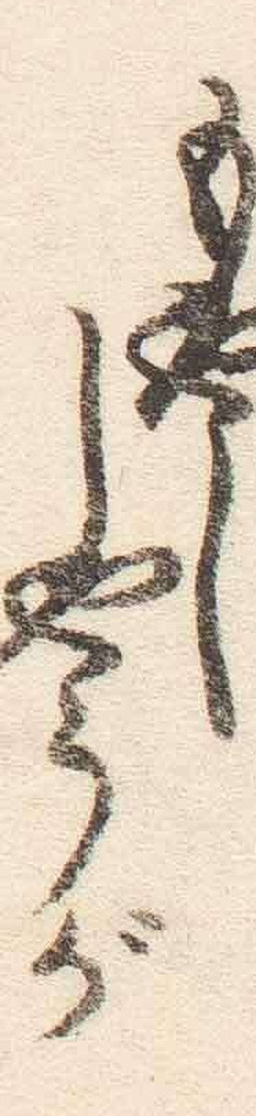しやうが
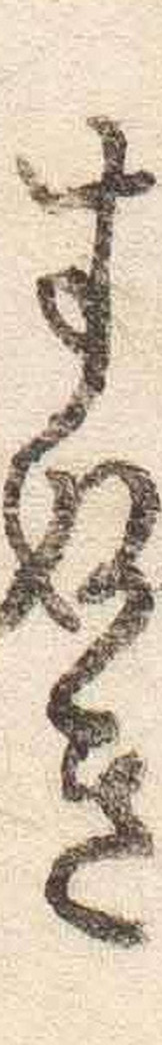すぬき
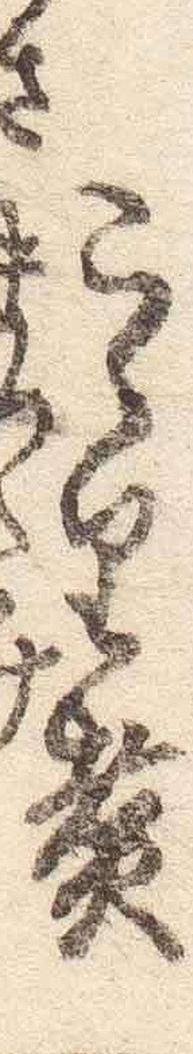こゝり煮
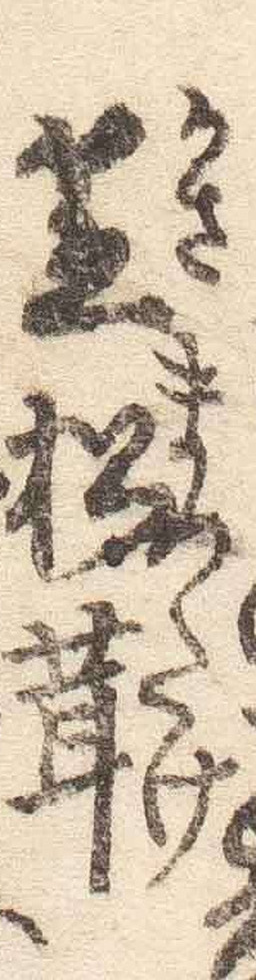笠松茸
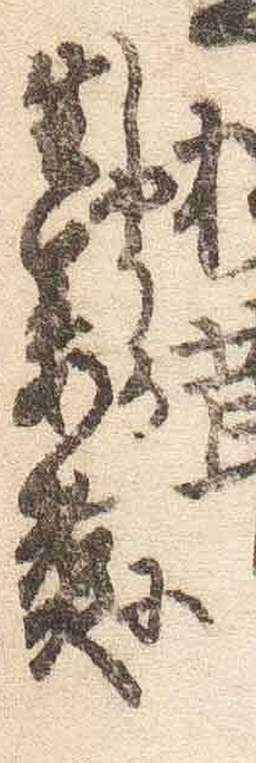生姜煮
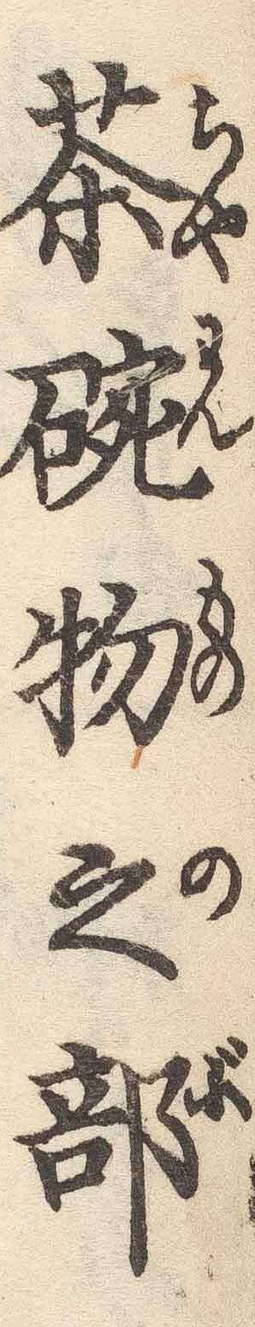茶碗物之部
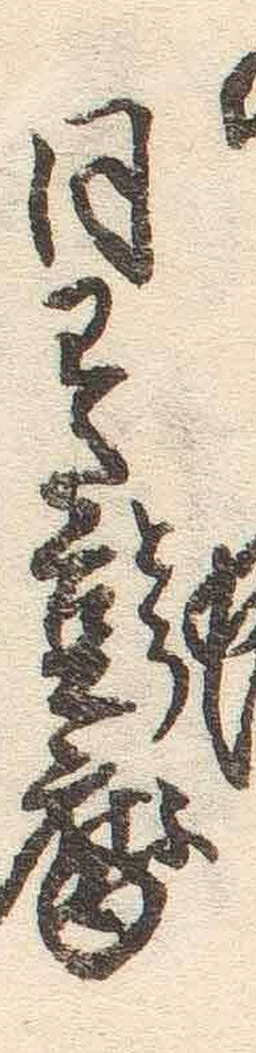同わた豆腐ず
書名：料理通
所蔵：東京学芸大学附属図書館 国文学研究資料館
